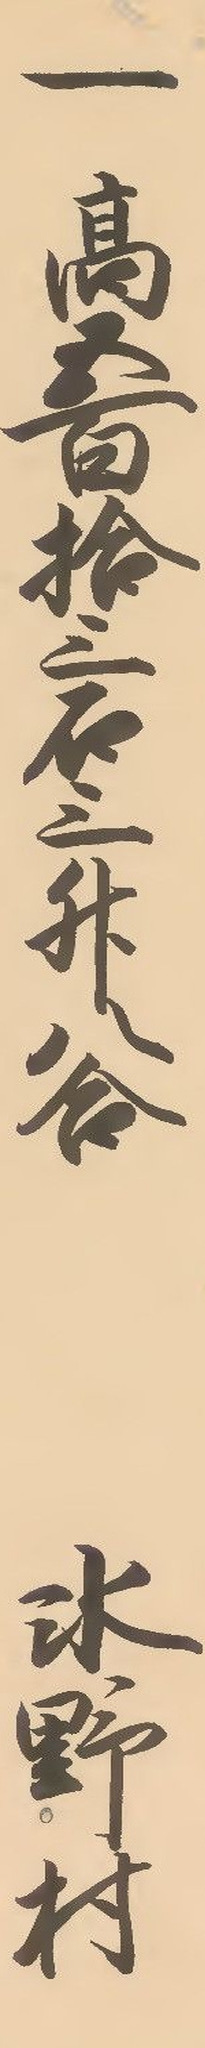一高五百拾三石三升八合氷野村
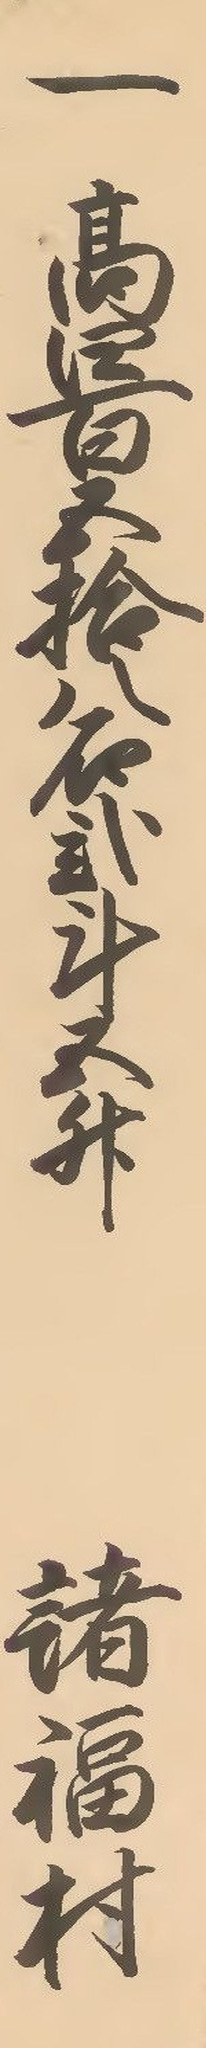一高四百五拾八石弐斗五升諸福村
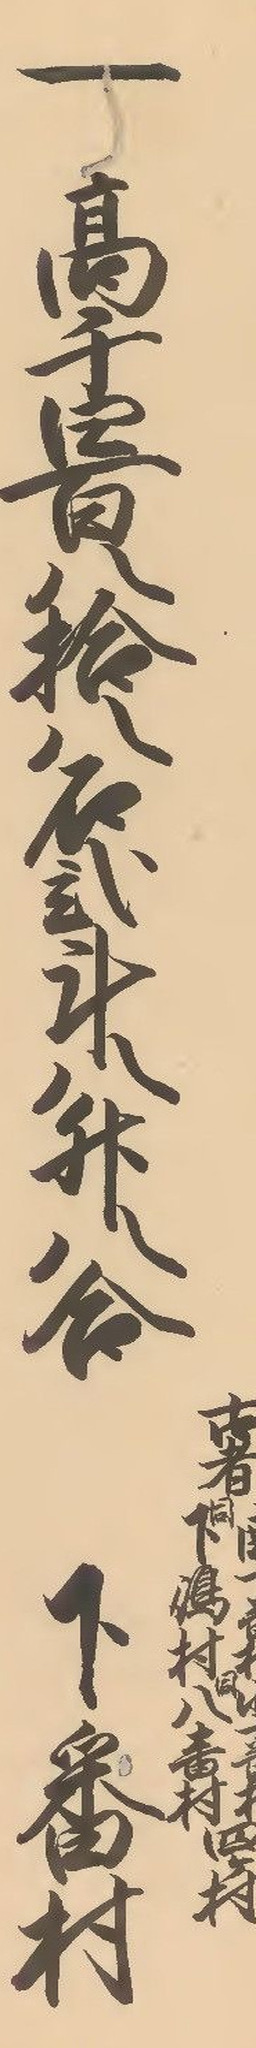一高四百五拾八石弐斗五升諸福村
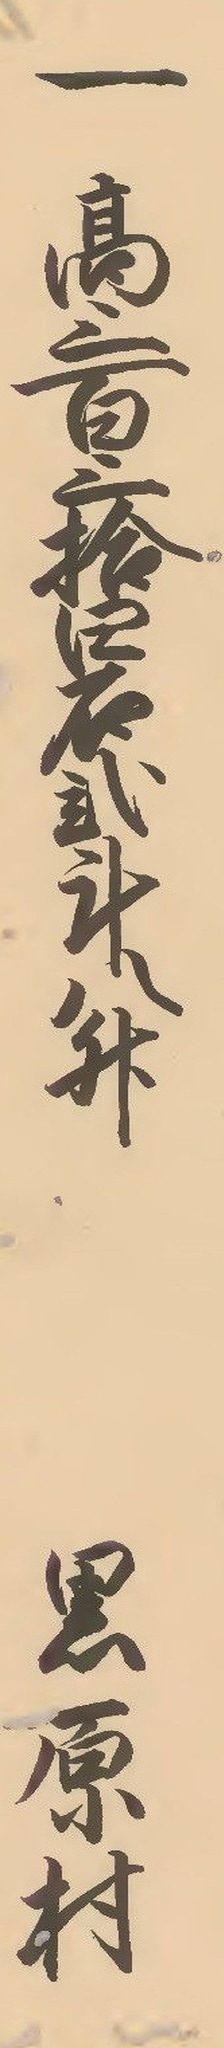一高三百三拾四石弐斗八升黒原村

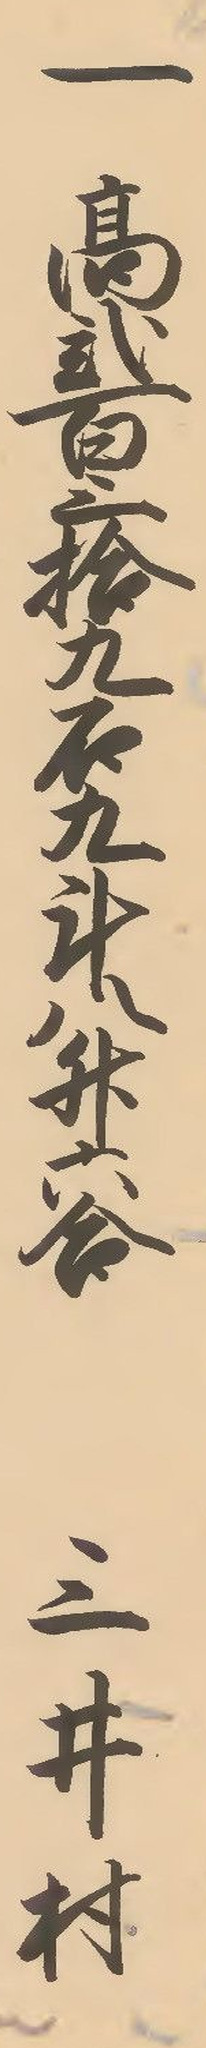一高弐百三拾九石九斗八升六合三井村
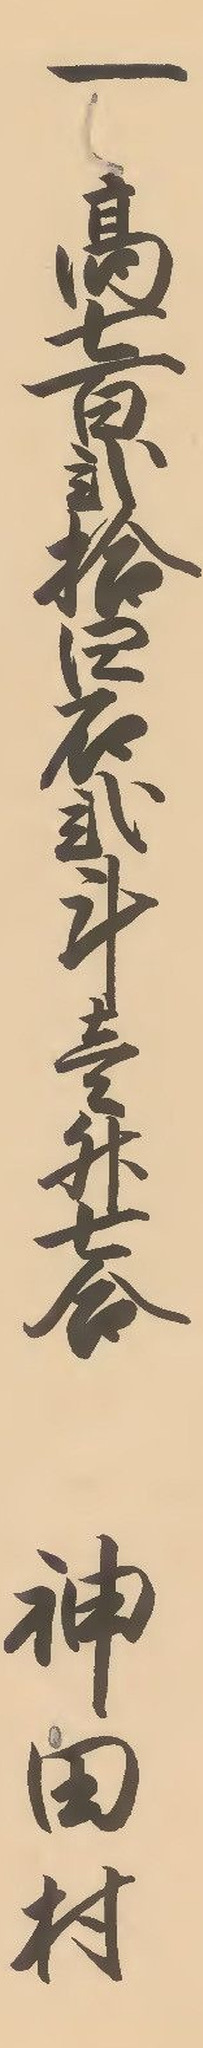一高七百弐拾四石弐斗壱升七合神田村
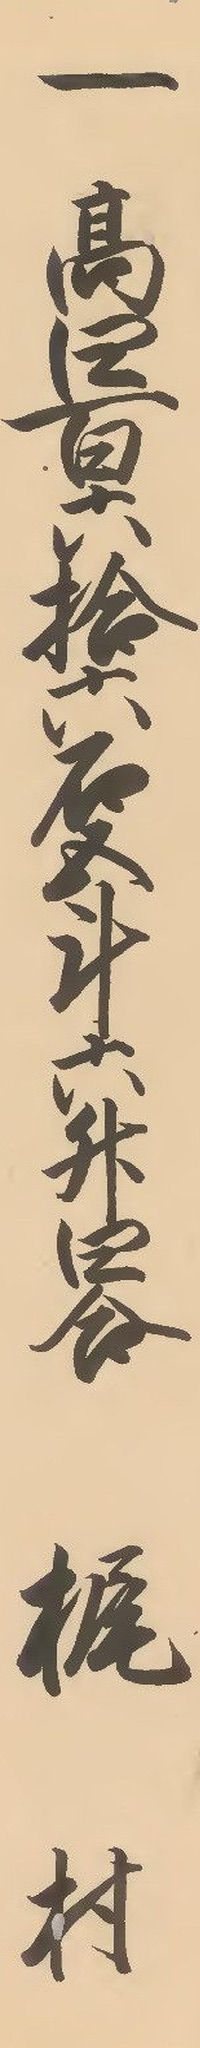一高四百六拾六石五斗六升四合梶村
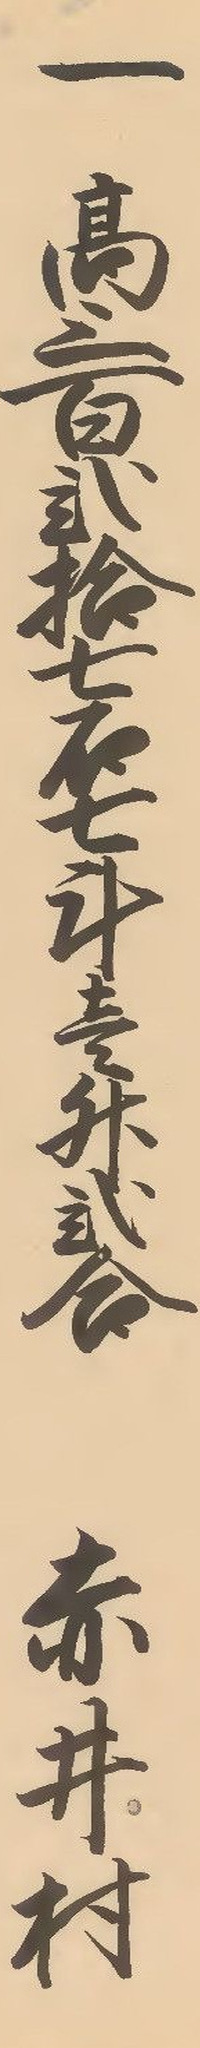一高三百弐拾七石七斗壱升弐合赤井村
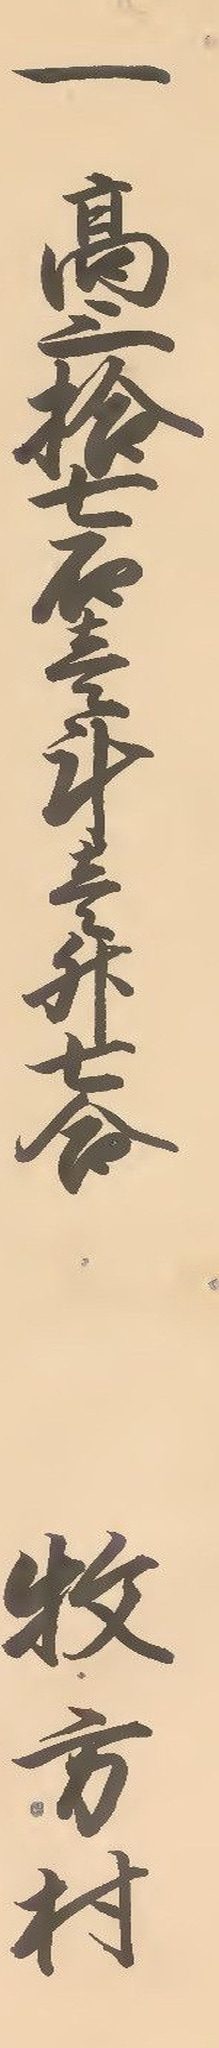一高三拾七石壱斗壱升七合牧方村

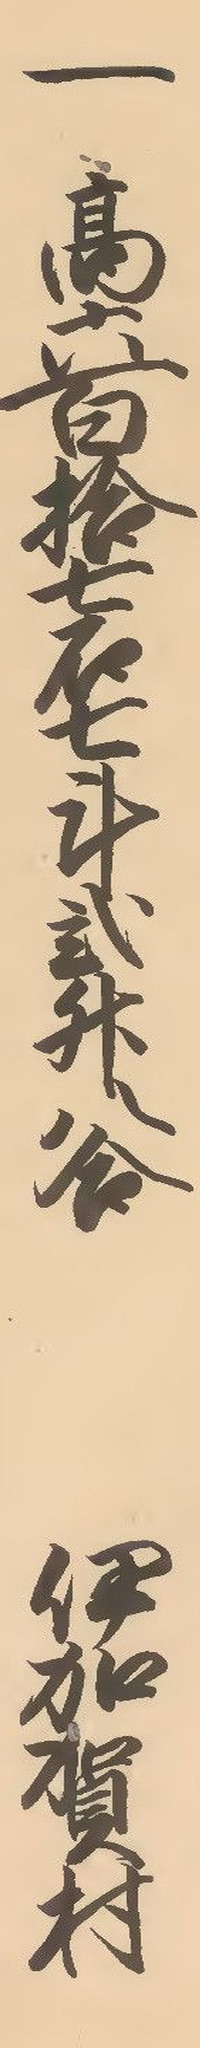一高六百拾七石七斗弐升八合伊加賀村
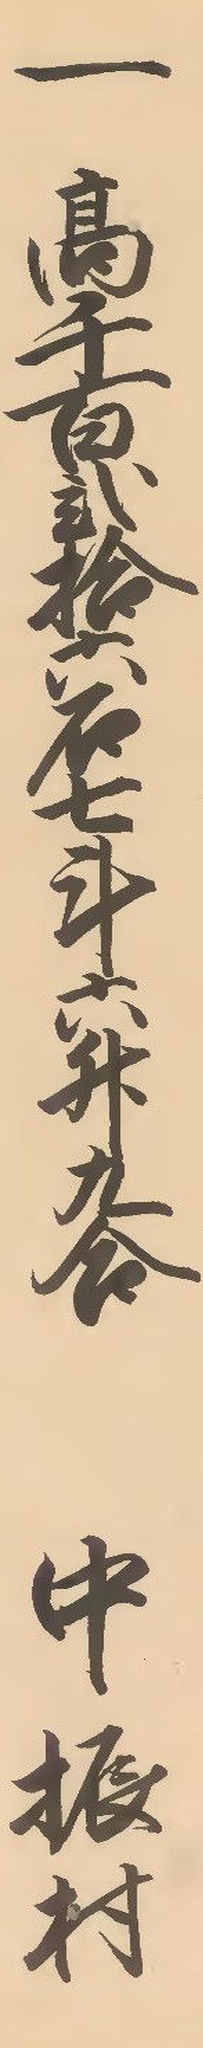一高千百弐拾六石七斗六升九合中振村
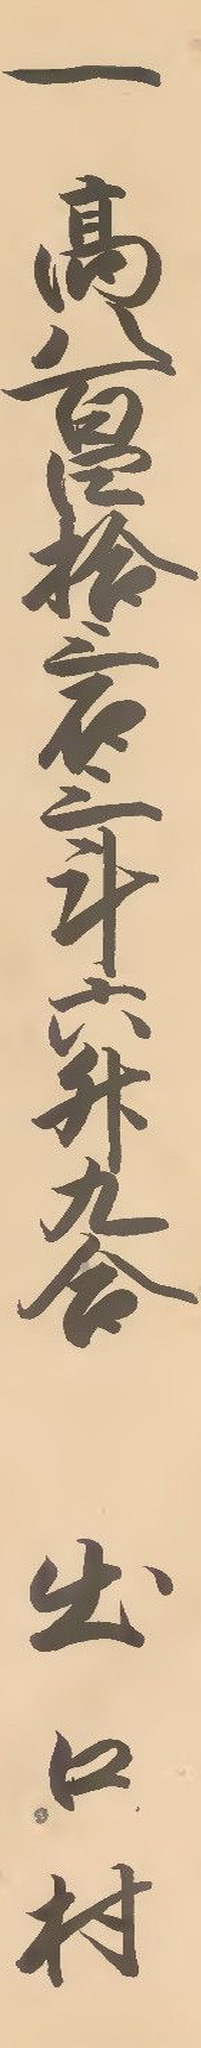一高八百四拾三石三斗六升九合出口村
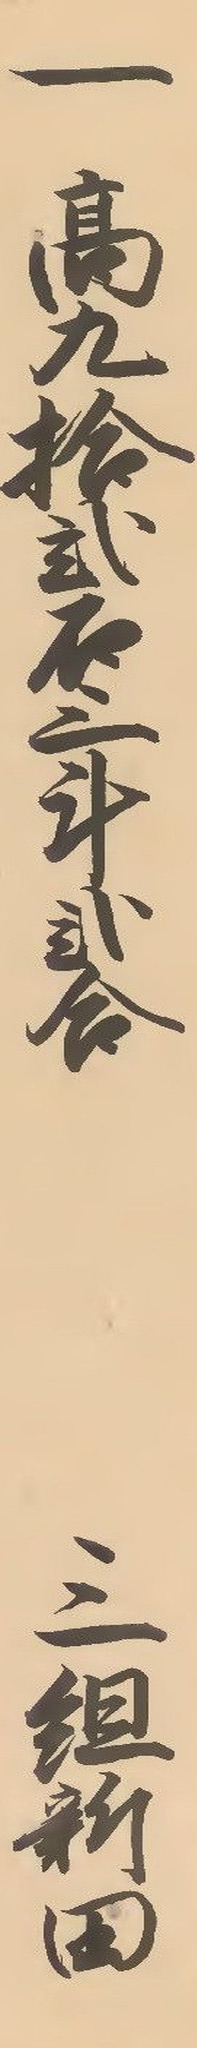一高九拾弐石三斗弐合三組新田
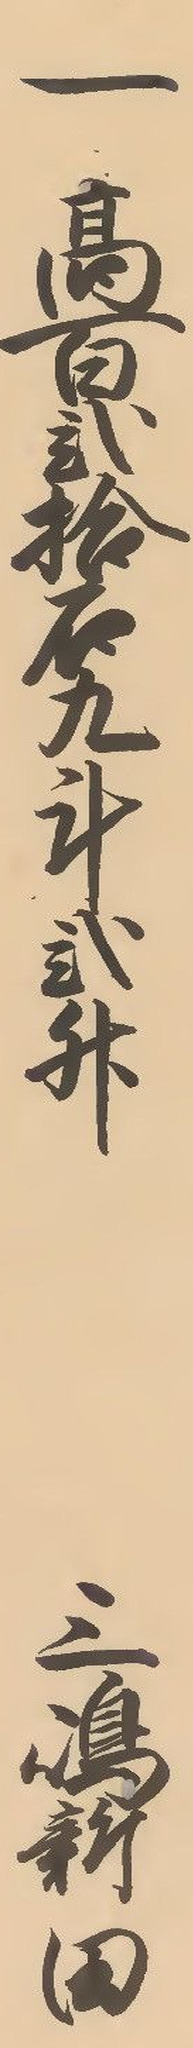一高百弐拾石九斗弐升三島新田
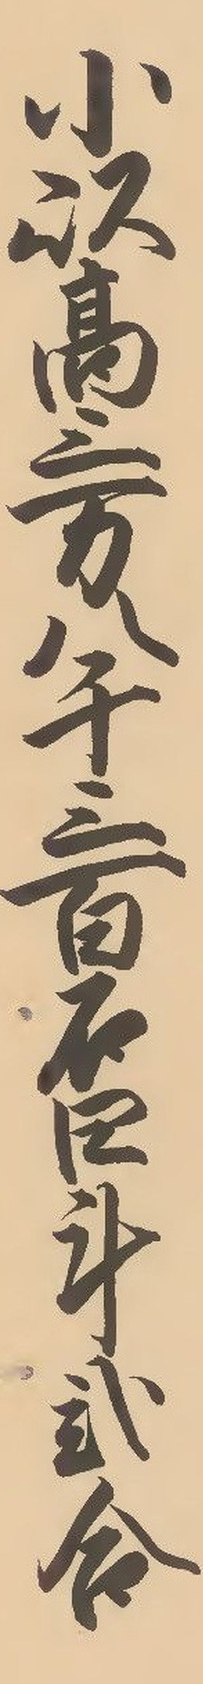小以高三万八千三百石四斗弐合

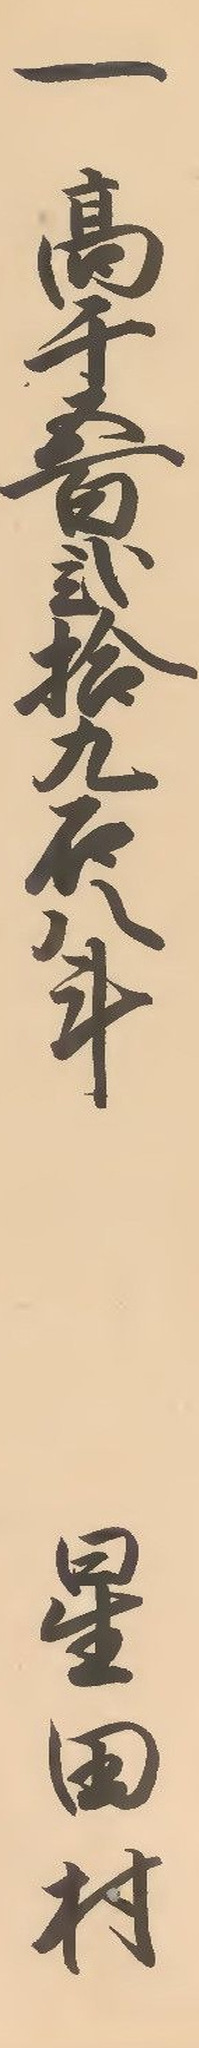一高千五百弐拾九石八斗星田村
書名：河内国郷帳
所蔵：国立公文書館 National Archives of Japan
